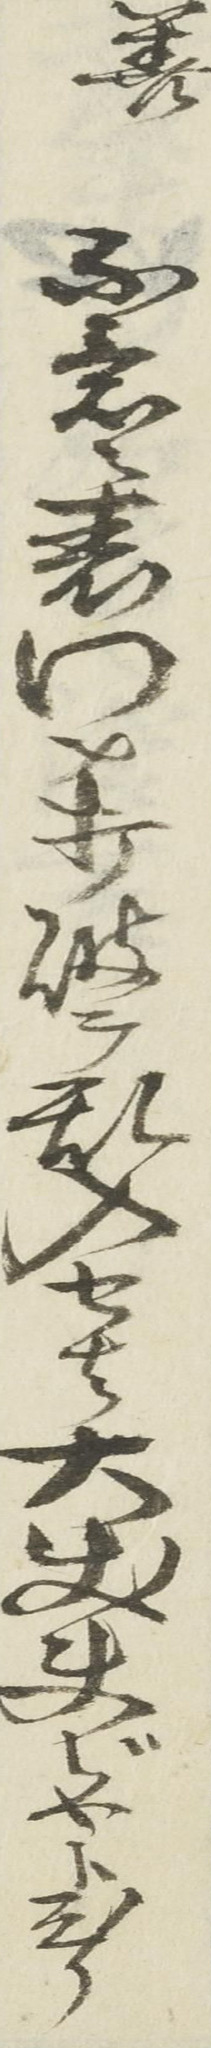善不意ニ表門ヲ打破テ乱入セは大丈夫じやト云り
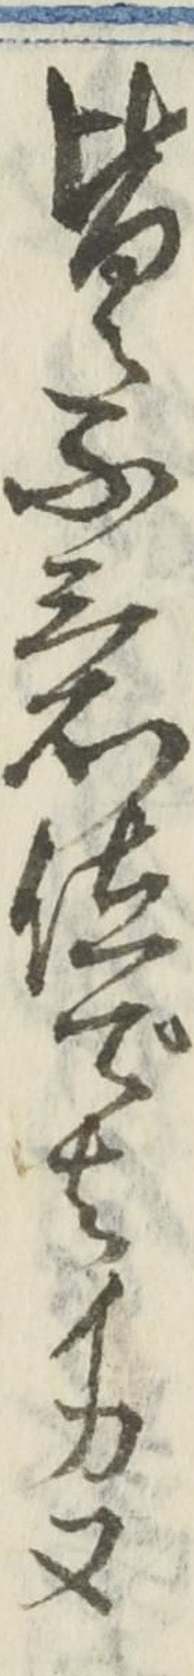皆々不意位ではイカヌ
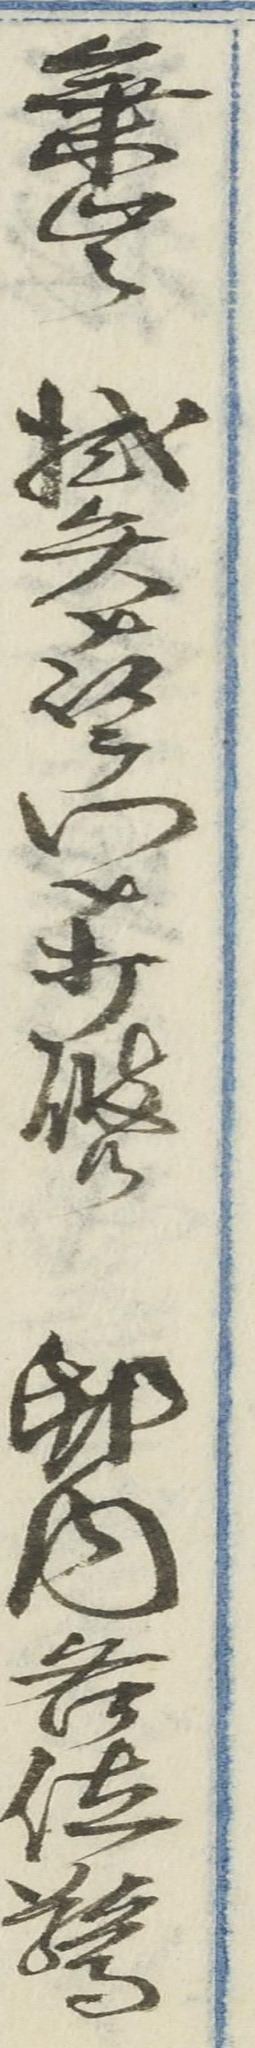乗出之掛矢ヲ以テ門ヲ打破ル邸内各位驚
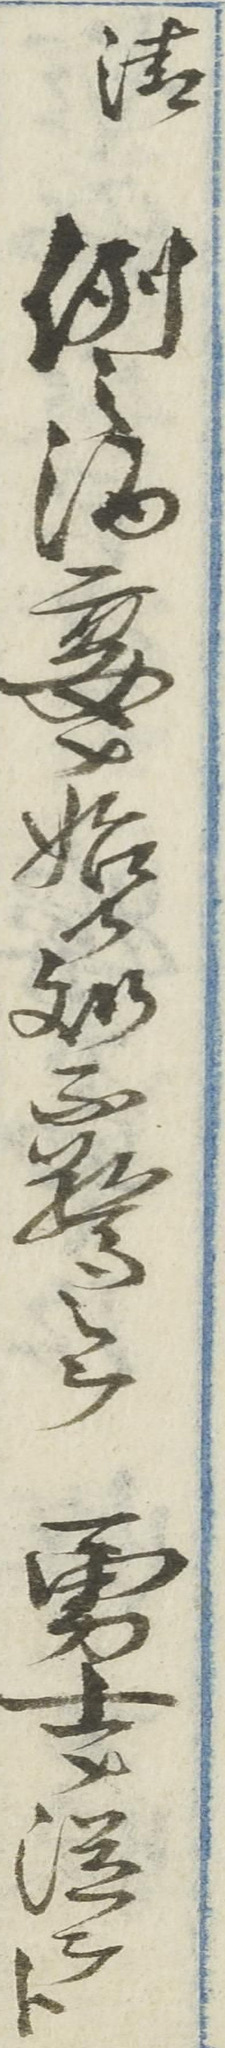清例之酒宴ヲ始ル処不驚シテ勇士ヲ従テト
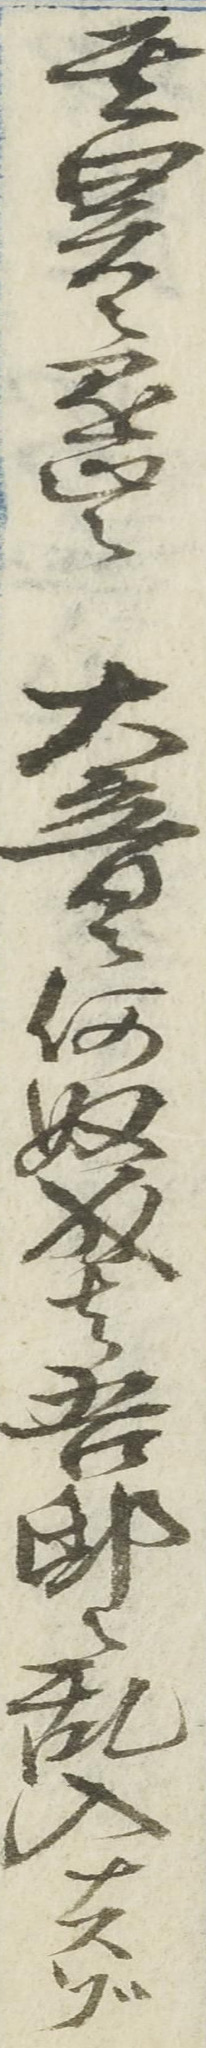玄関ニ懸出し大音之何奴成は吾邸ニ乱入ナスゾ
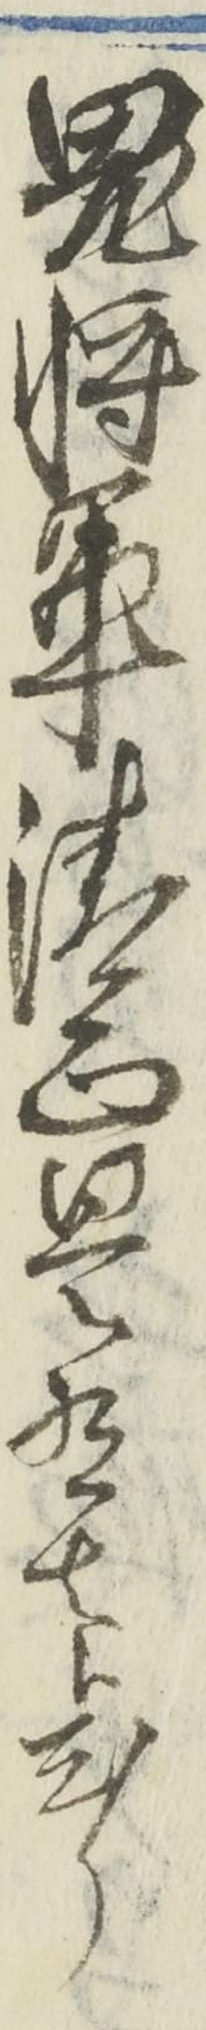鬼？将軍清正是有はト云ウ
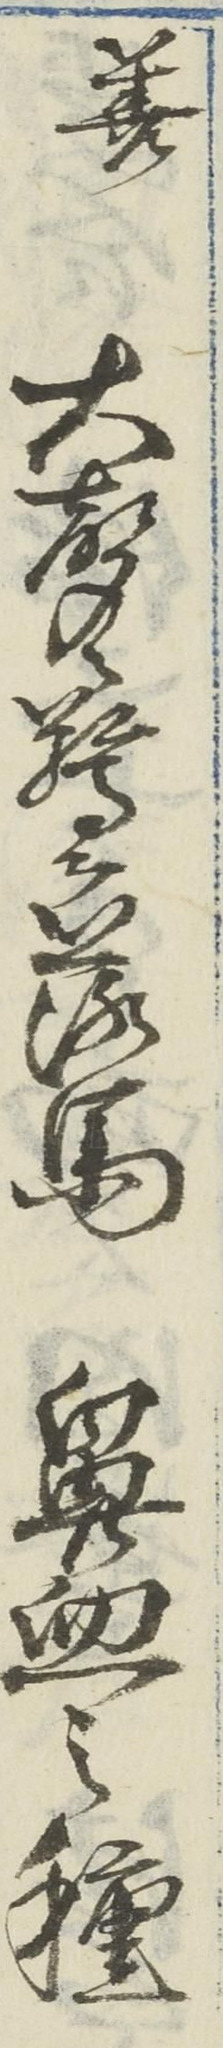善大声ニ驚テ落馬鼻血之種
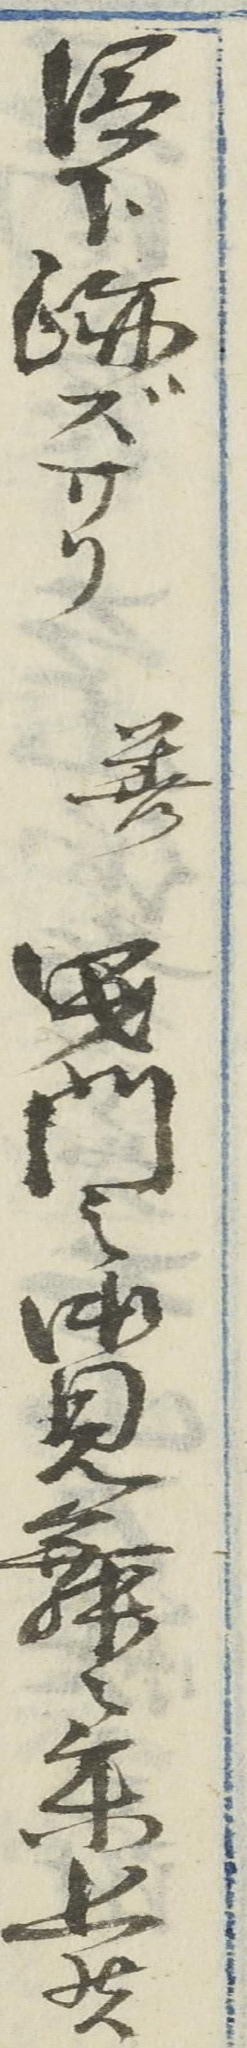臣下跡ズサリ善閉門之御見舞ニ参上候
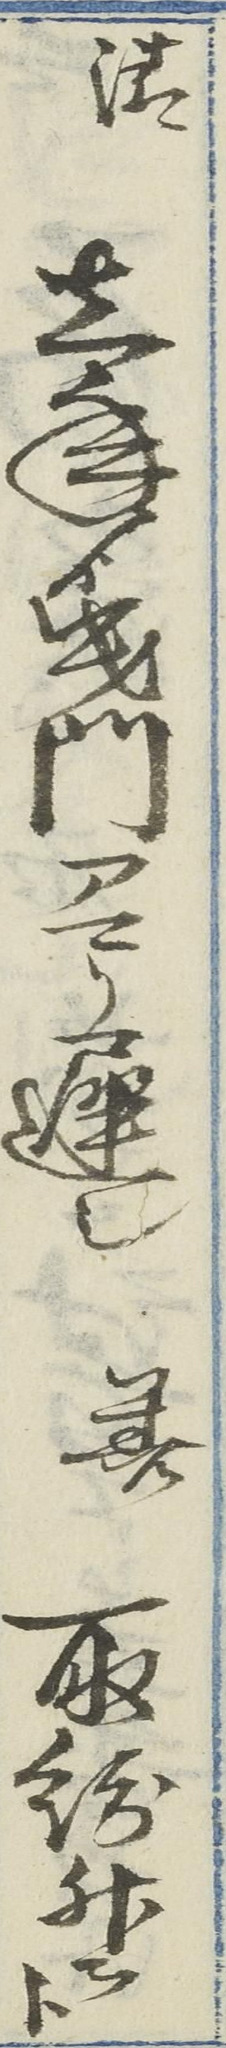清先年ゟ閉門アマリ遅し善取紛升テト
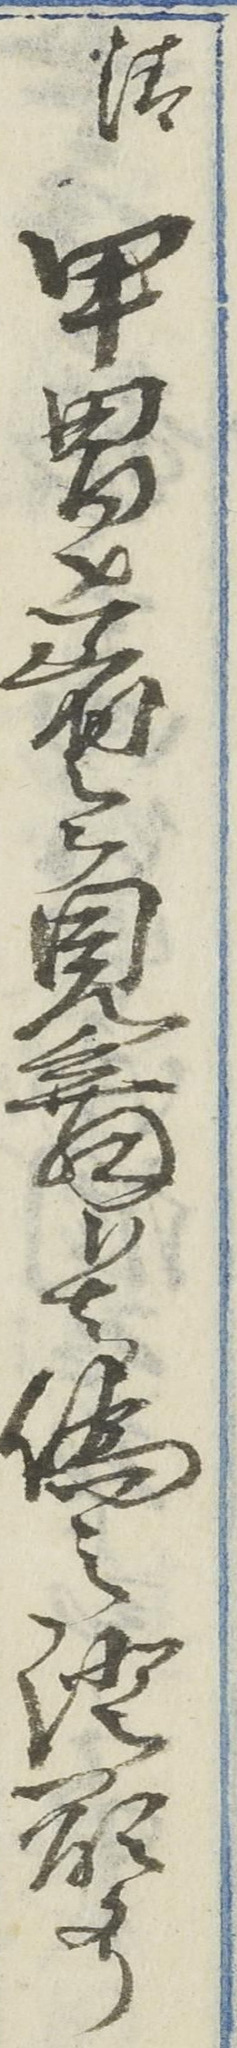清甲冑ヲ着シテ見舞トは偽之証顕タリ
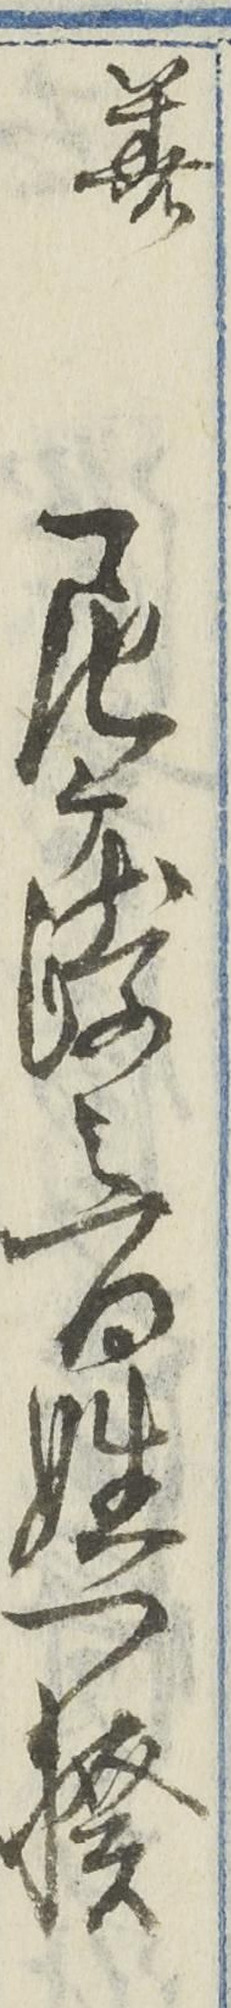善尼ヶ崎之百姓一揆
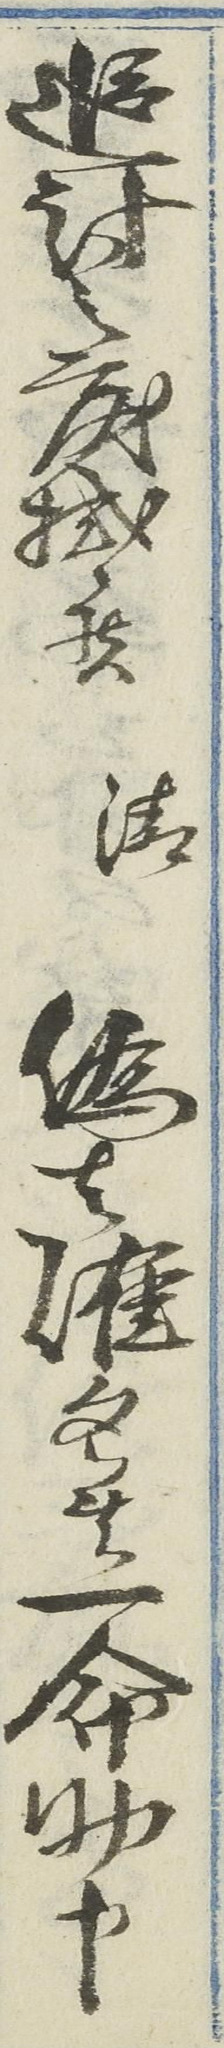追討之戻掛ニ候清偽は確タリ共一命助申
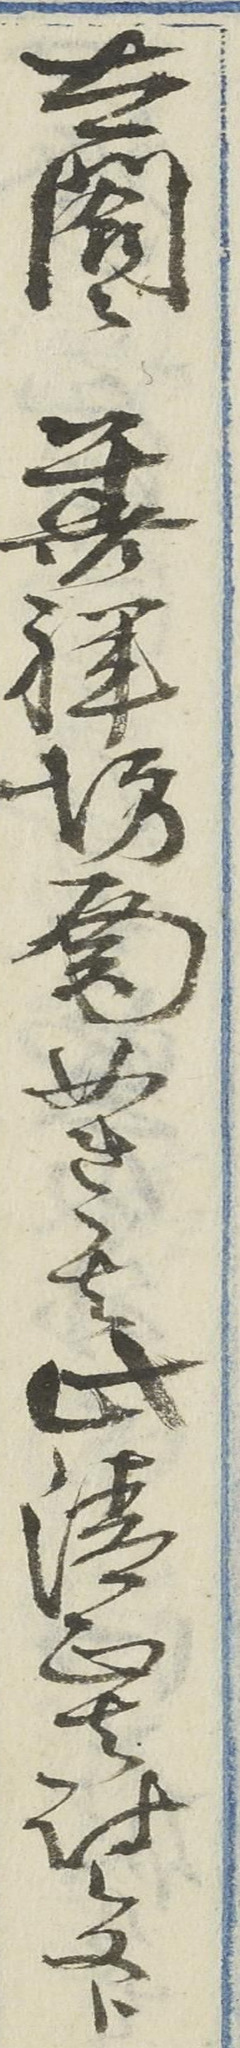太閤ニ善祥坊殿如きは此清正は討レヌト
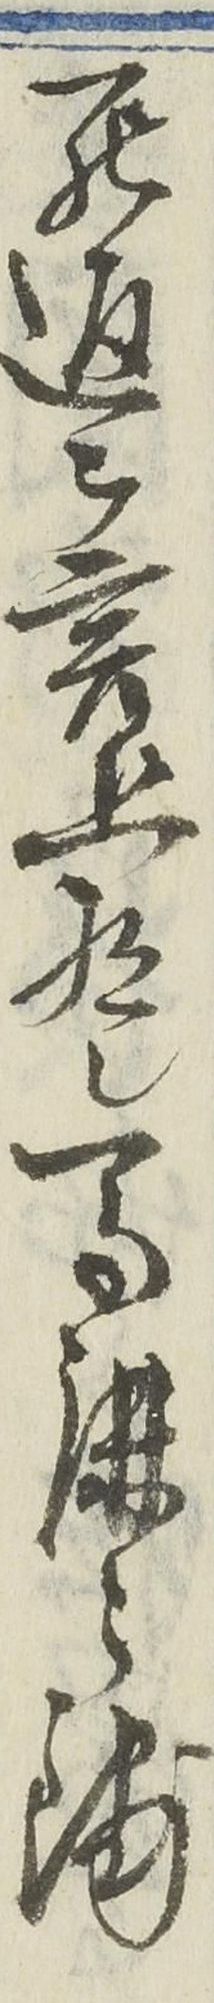取返テ言上有し馬沸々鋪
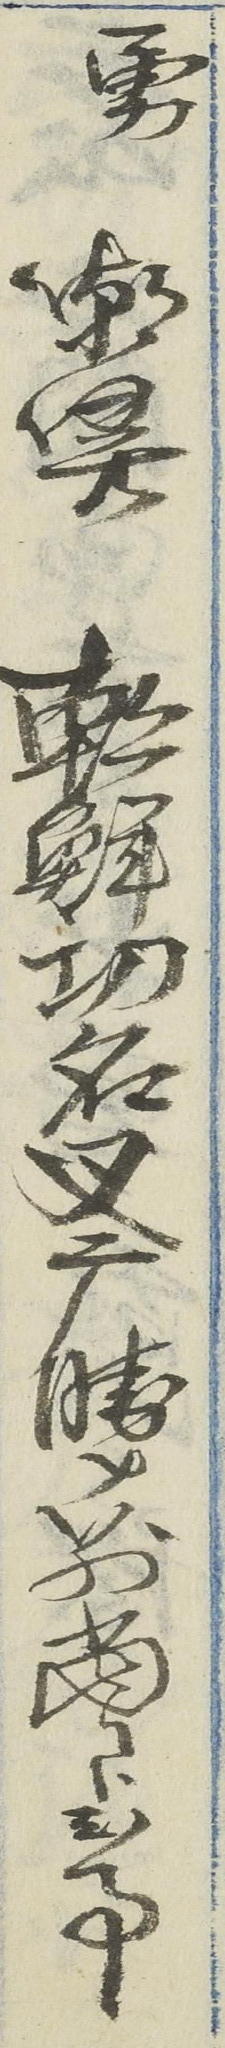勇嘲朝鮮功名又テ勝ヲ別当コト云事
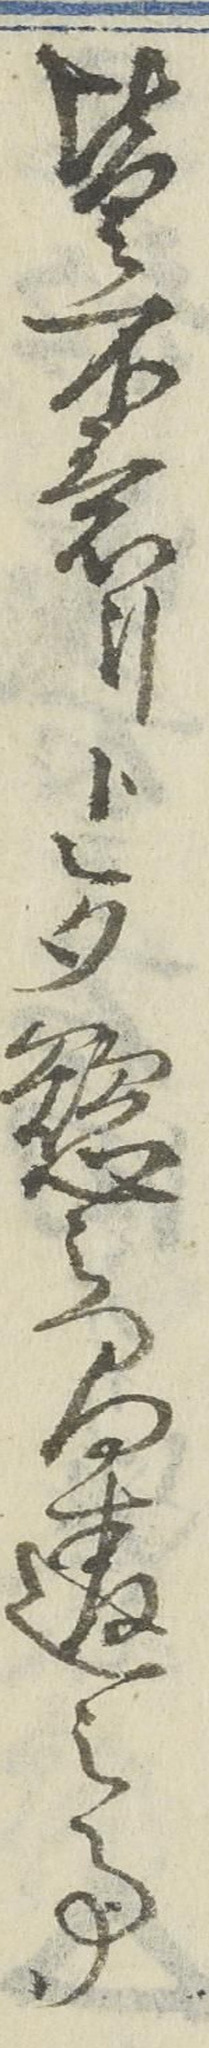皆々不意トシタ慾之間違之事
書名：伏水大地震
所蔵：東京大学地震研究所図書室 Earthquake Research Institute Library, The University of Tokyo, JAPAN
